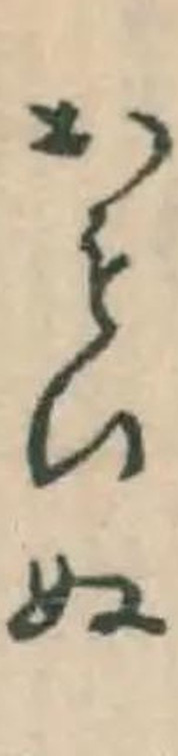おもひぬ

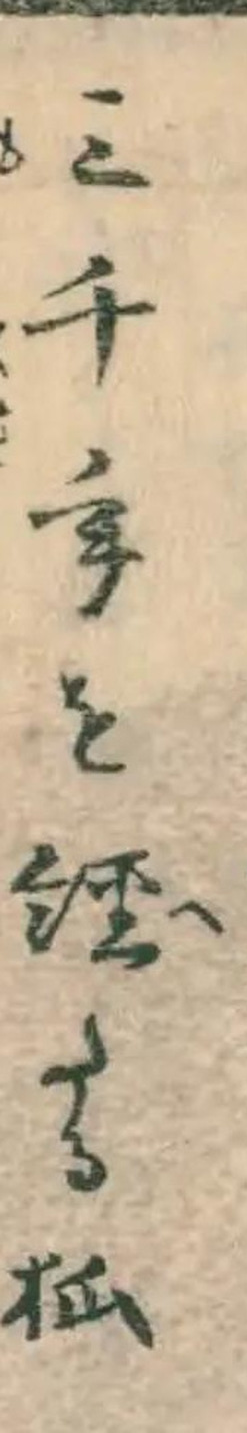三千年を経たる狐
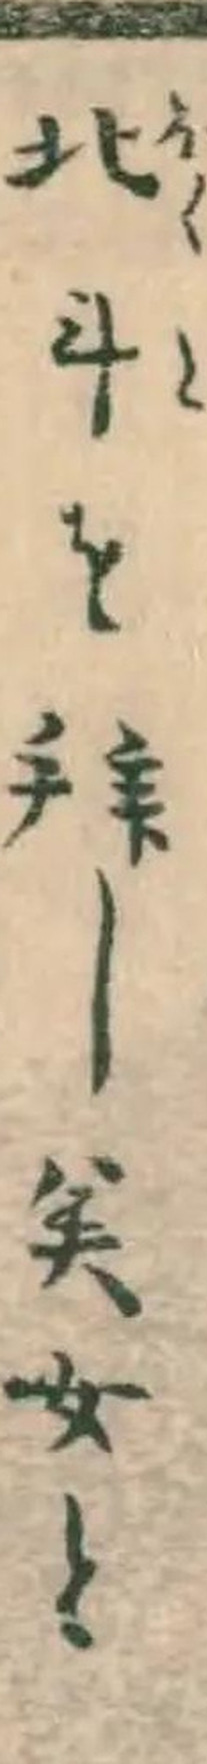北斗を拜し美女と
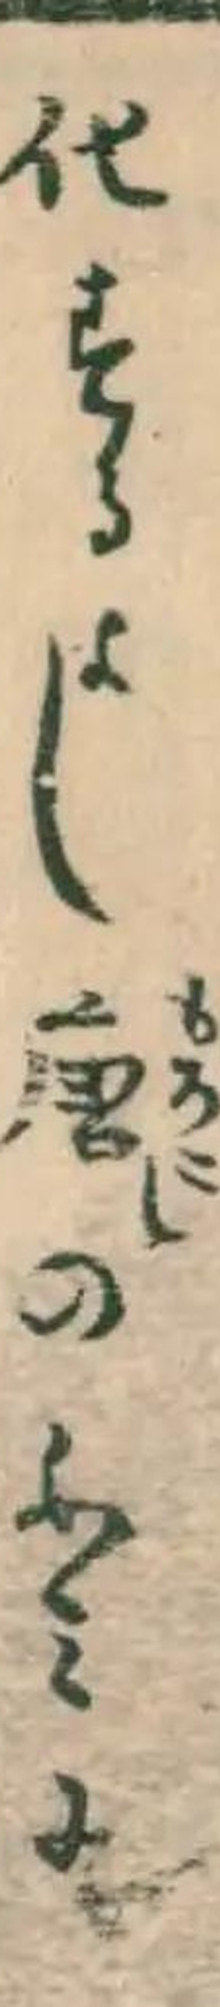化するよし唐のふみに
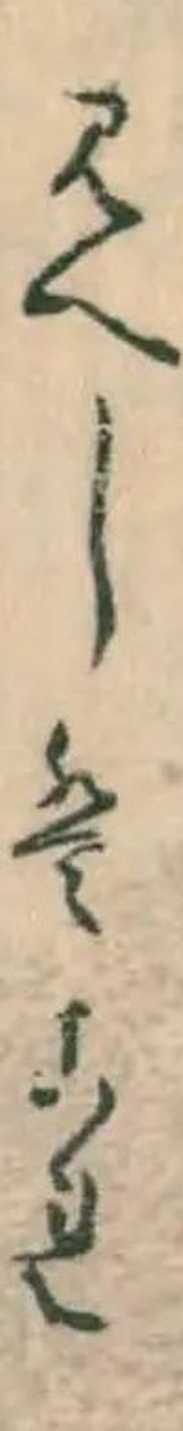見へしはこれ
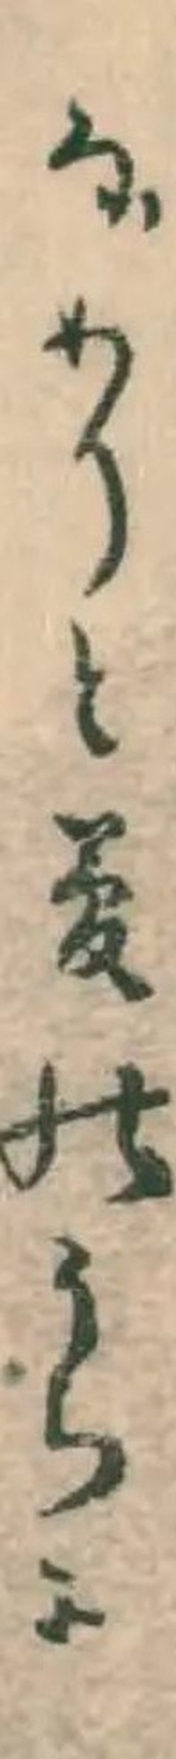なめりと夢のうちに
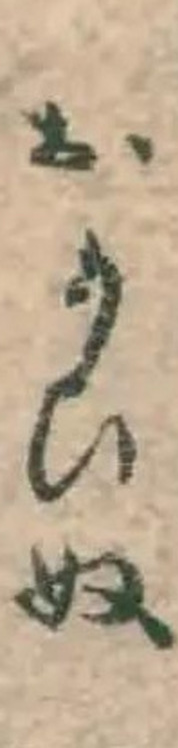おもひぬ
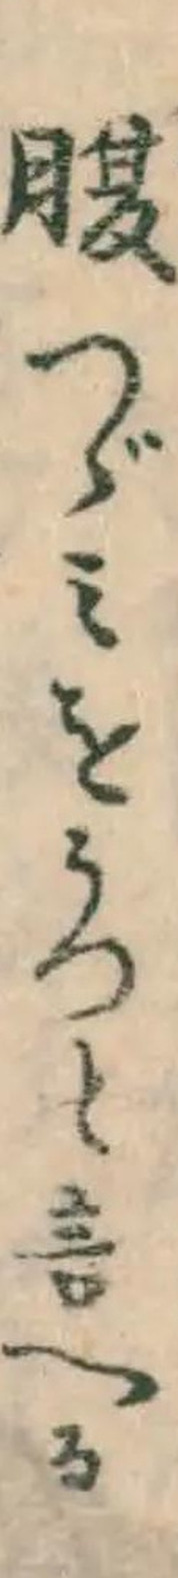腹つゞみをうつと言へる
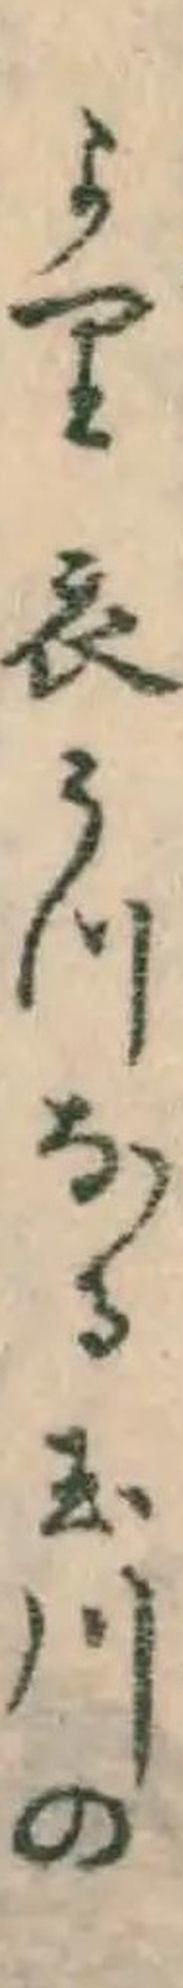より衣うつなる玉川の
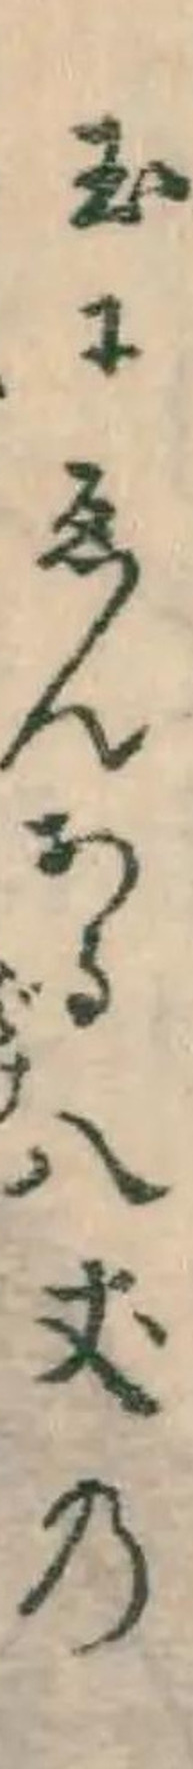玉にゑんある八丈の
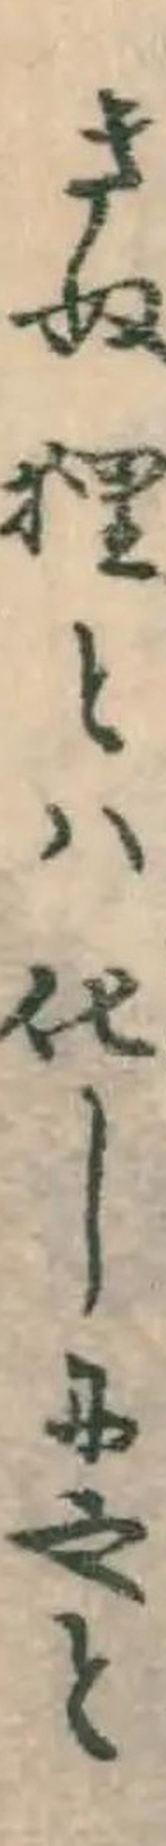きぬ狸とは化しにやと
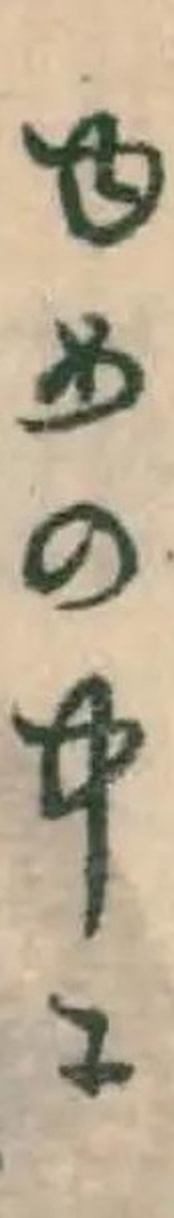ゆめの中に
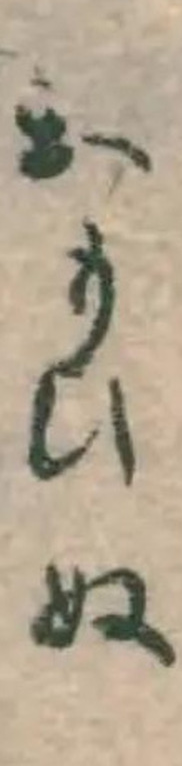おもひぬ

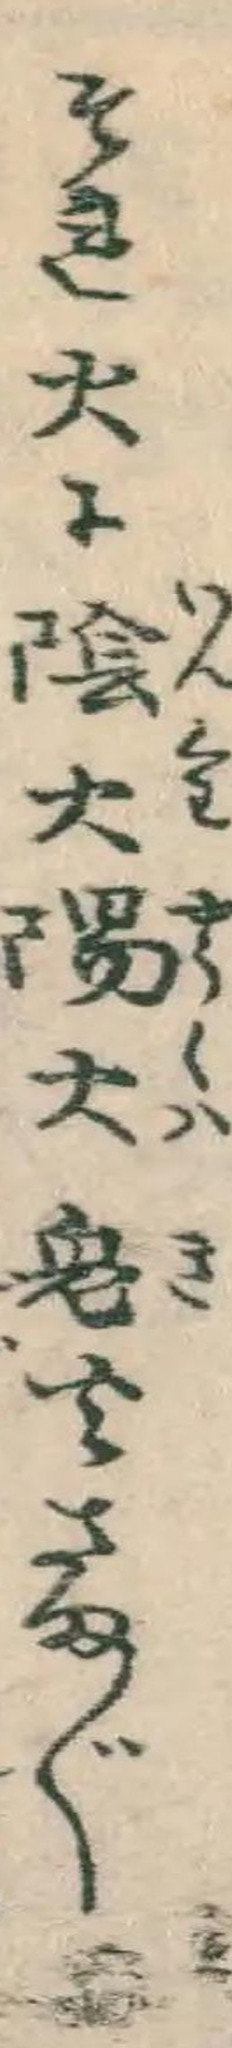それ火に陰火陽火鬼火さま〴〵
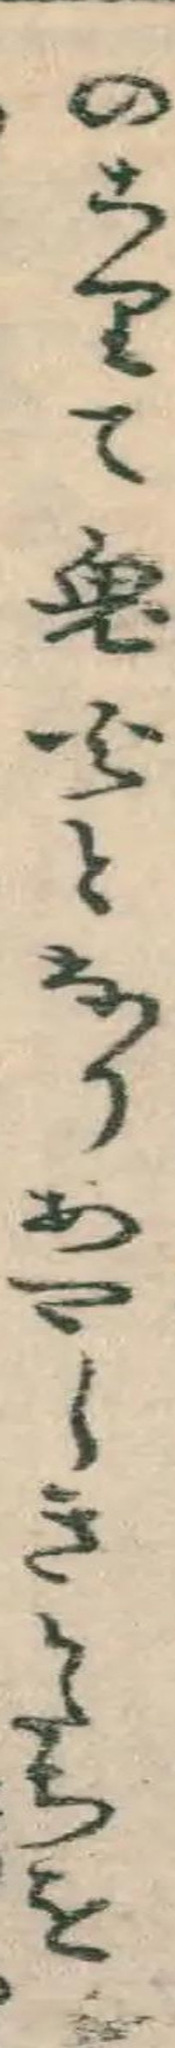のこりて鬼火となりあやしきかたちを
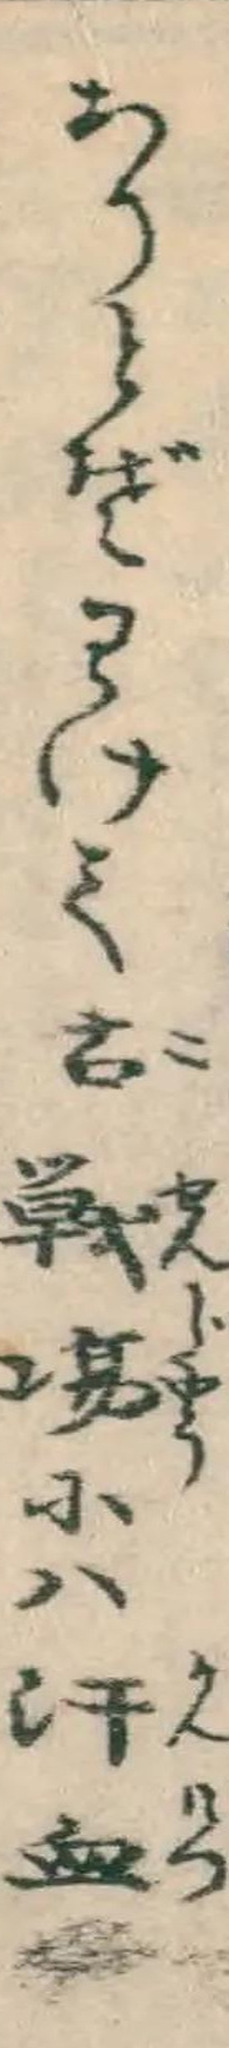ありとぞわけて古戦場には汗血
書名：百鬼徒然袋 3巻. [1]
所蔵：国立国会図書館 National Diet Library, JAPAN
